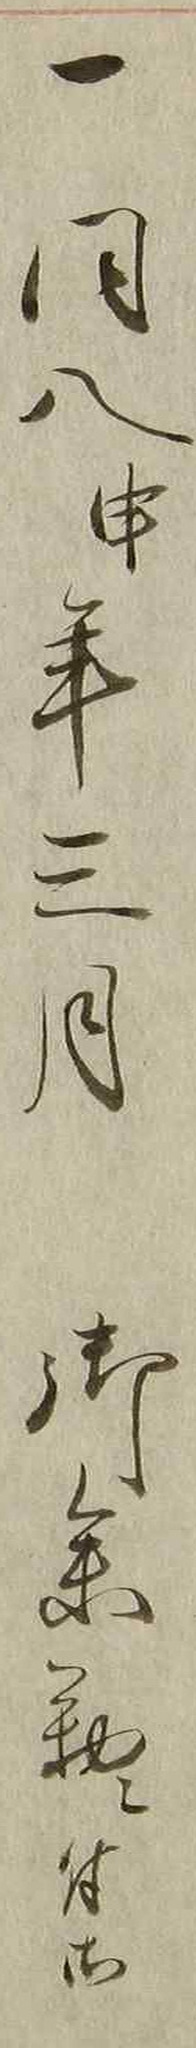一同八申年三月御参勤に付御
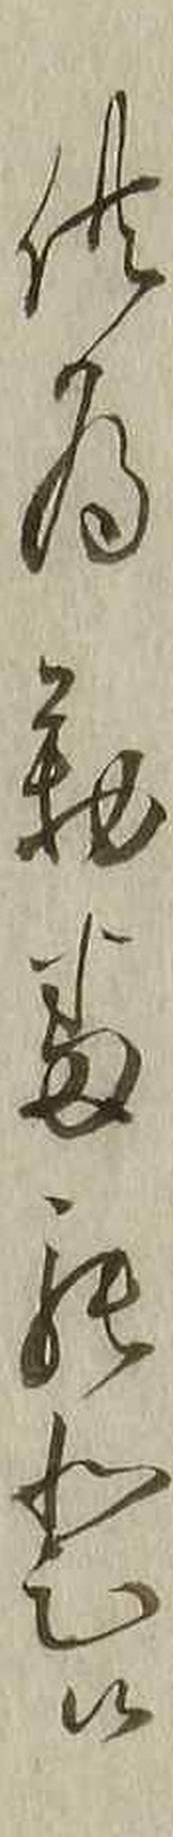供為勤番罷登候
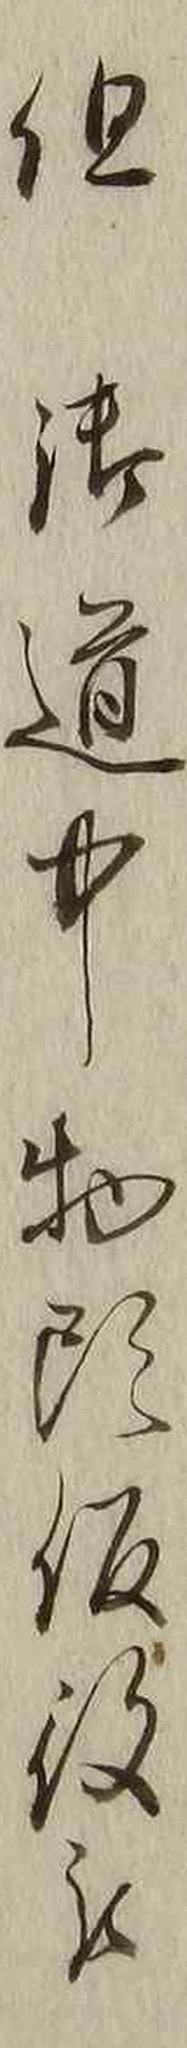但御道中物頭仮役被
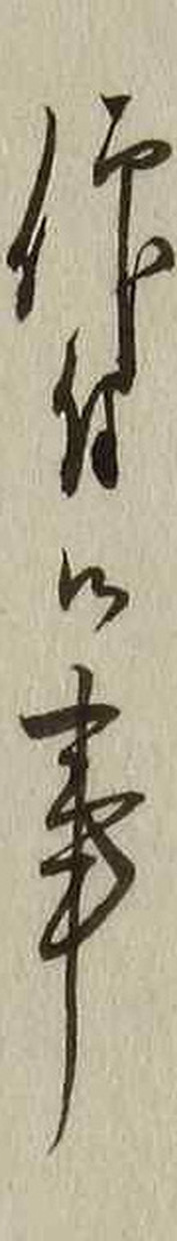仰付候事
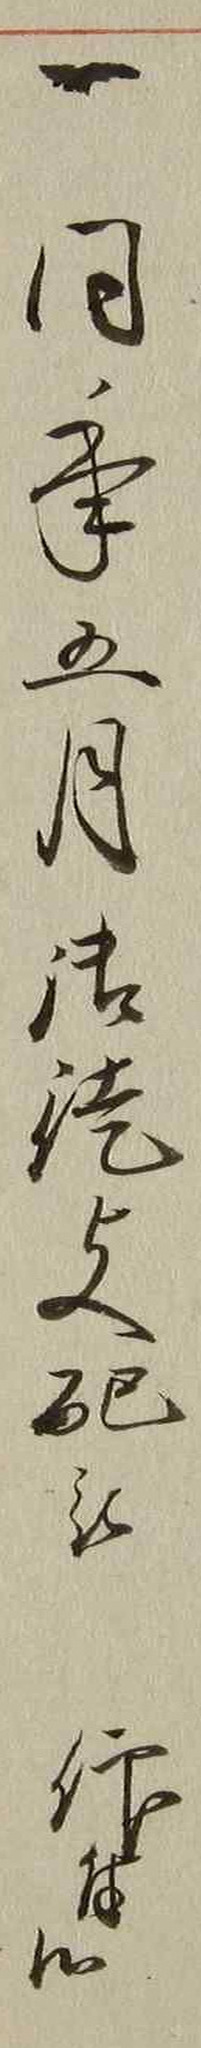一同年五月御徒支配被仰付候
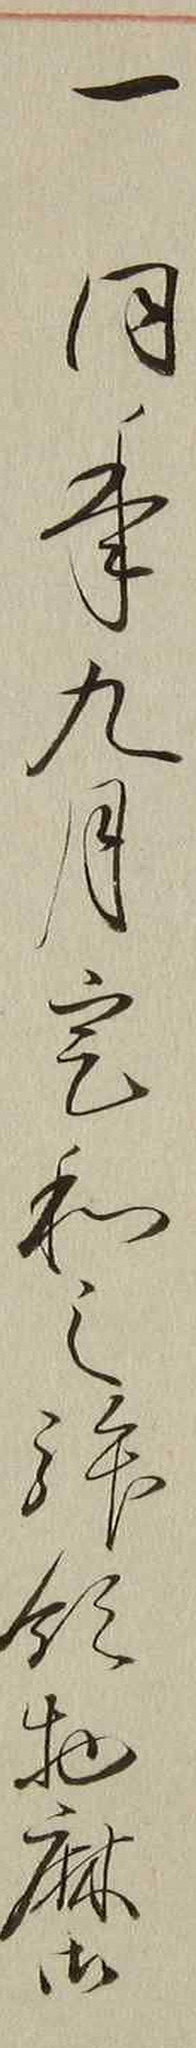一同年九月定和之拝領物麻御
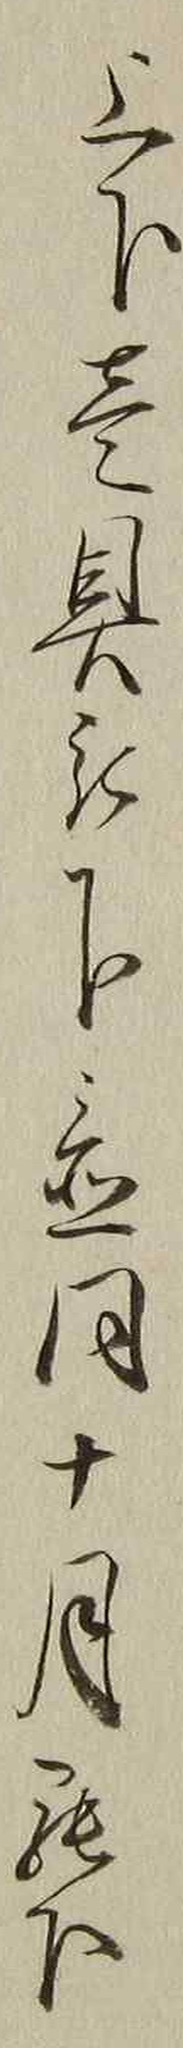上下壱具被下置同十月罷下
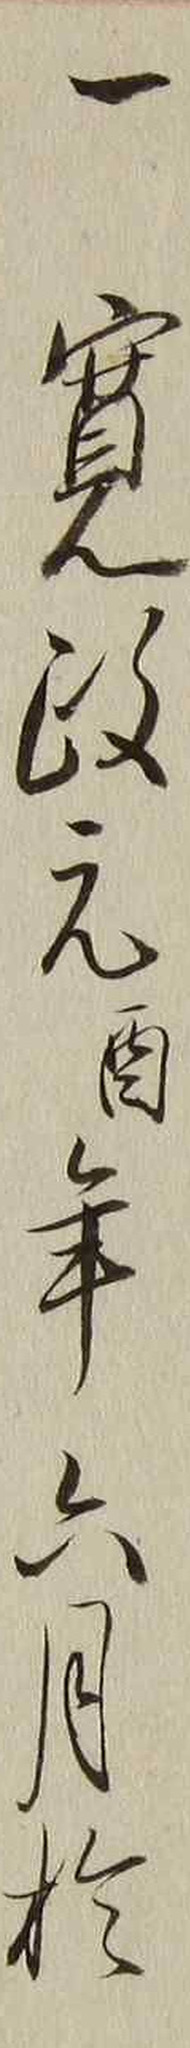一寛政元酉年六月於
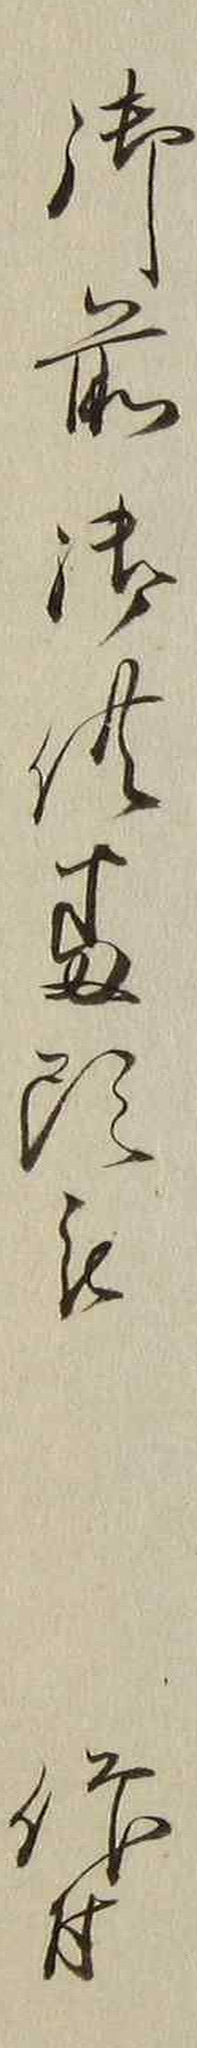御前御供番頭被仰付
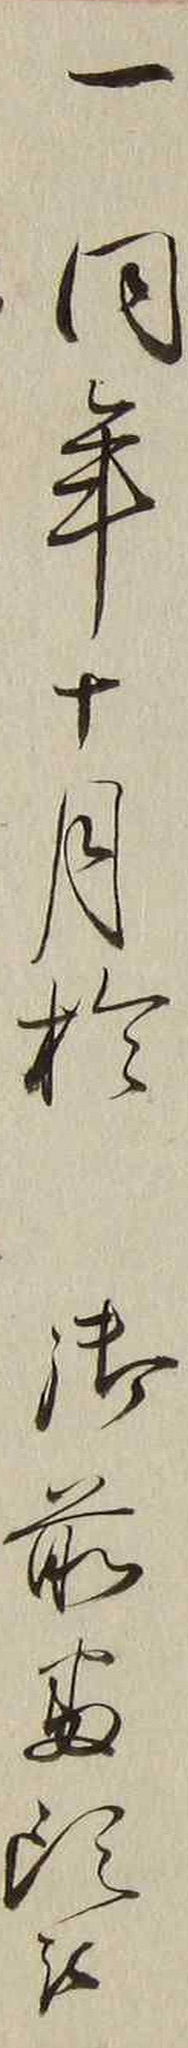一同年十月於御前番頭被
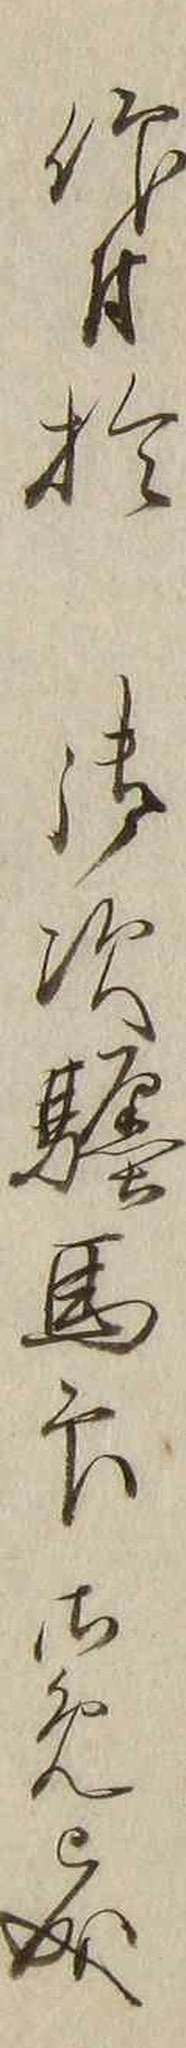仰付於御次馬印御免被成
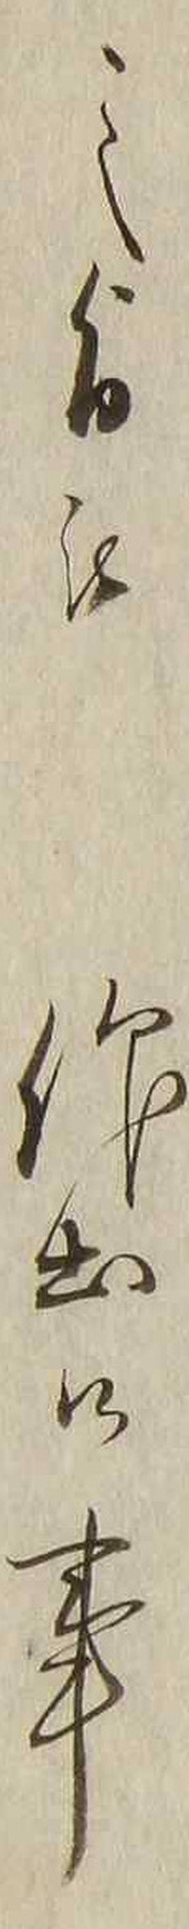之旨被仰出候事
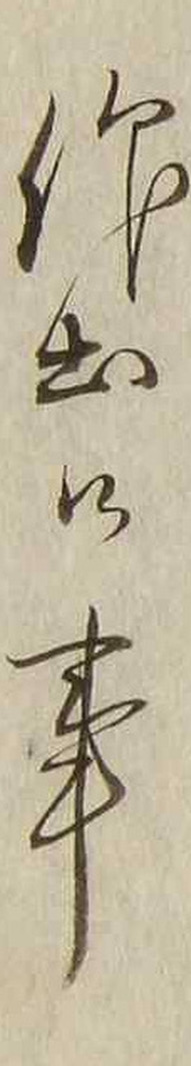仰付候事

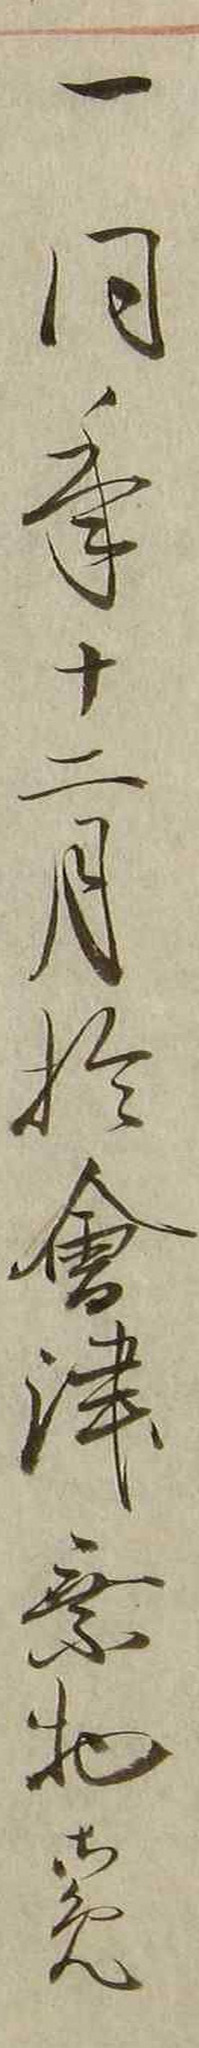一同年十二月於会津乗物御免
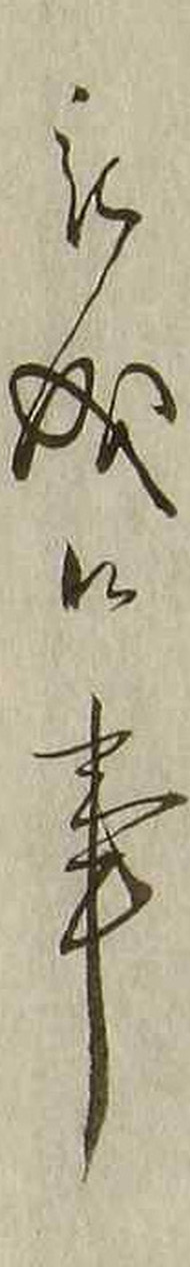被成候事
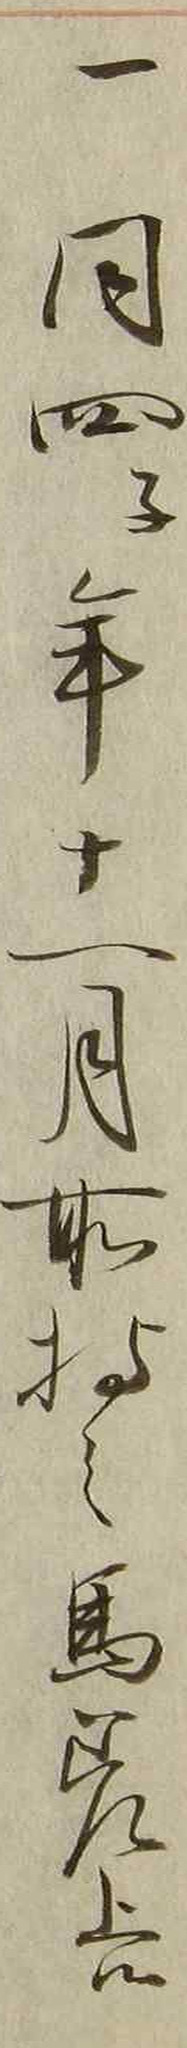一同四子年十一月所持之馬差上候
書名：諸士系譜　巻之103　か之部11
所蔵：会津若松市立会津図書館
